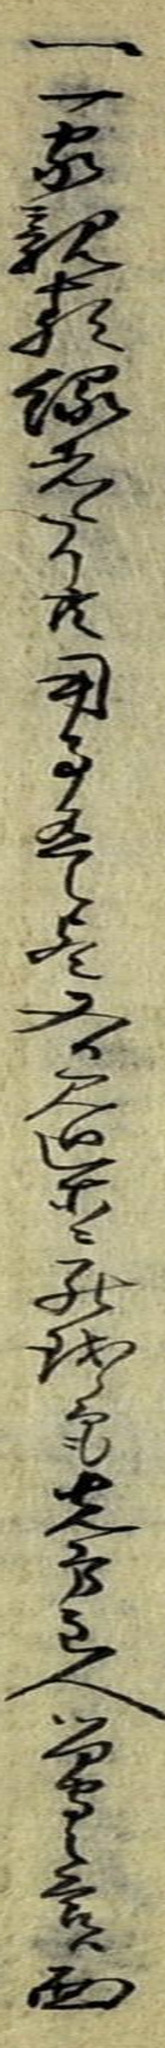一一家親類縁者たり共用事有之歟又ハ見廻等ニ罷越候而も先方主人留守之節ハ面
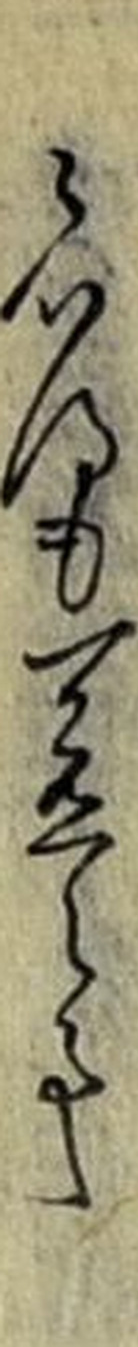々心得も可有之事
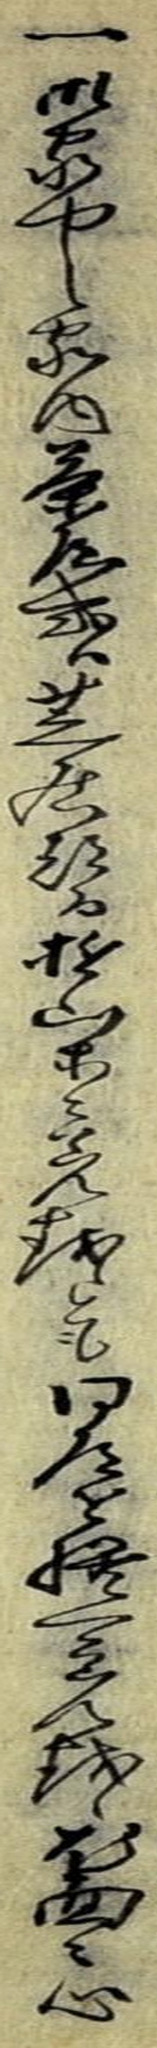一御家中之家内茶屋或ハ芝居都而遊山等ニ差越とも同道を拱？可差越候尤面々心
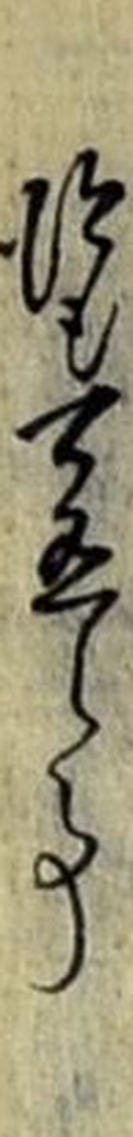得も可有之事
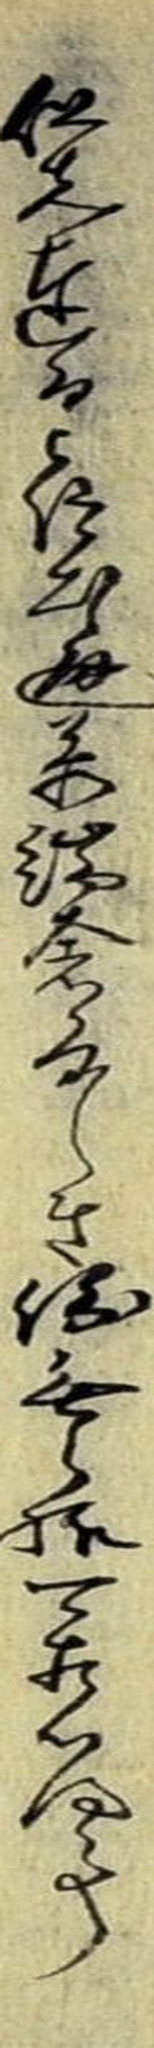但先達而被仰出候通万端奢かましき儀無之様可相心得事
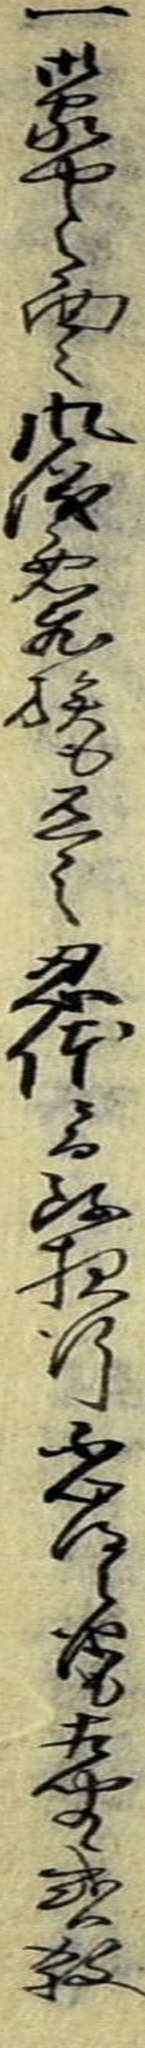一御家中之面々風儀悪敷族も有之忍体ニ而致夜行不心得之儀も相聞候或ハ殺
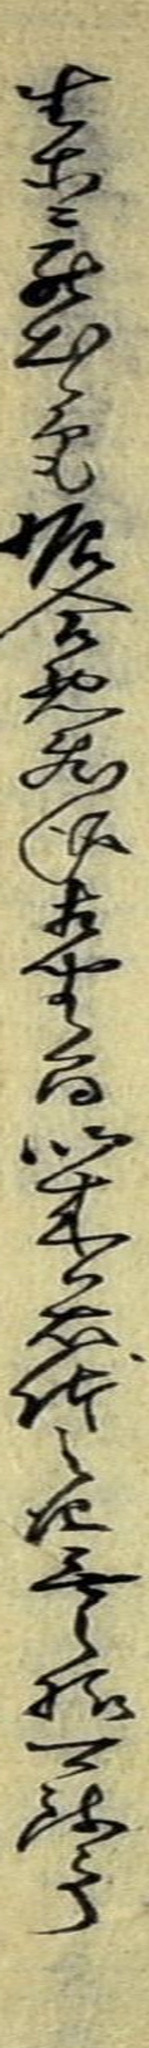生等ニ罷出候而も振合悪敷趣相聞候間以来ハ右体之儀無之様可致事
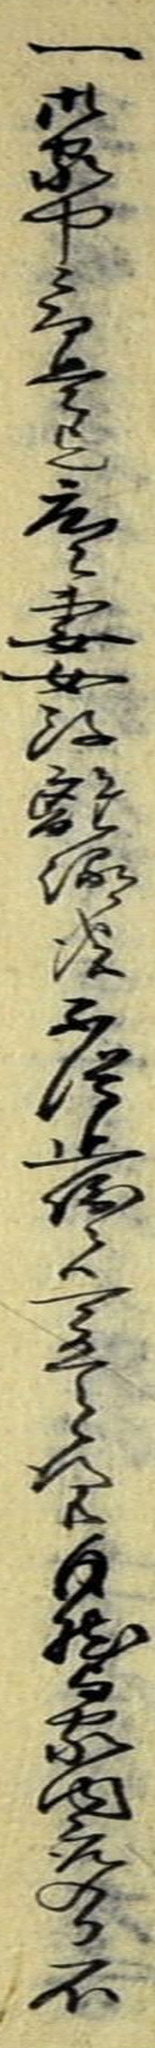一御家中ニ而是迄度々妻女致離縁候儀ハ不得止儀ニハ可有之候得共自然与家内取〆り

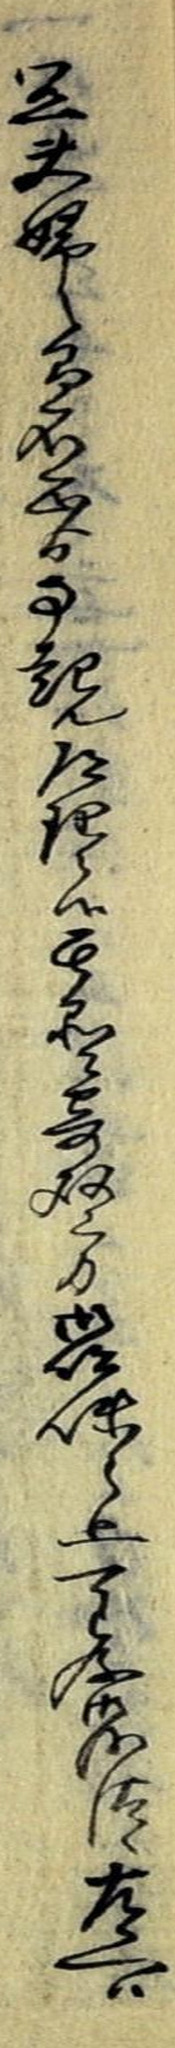宜夫婦之間不正ゟ事起ル道理ニ候其品ニ寄双方御吟味之上可被及御沙汰候左候ヘハ
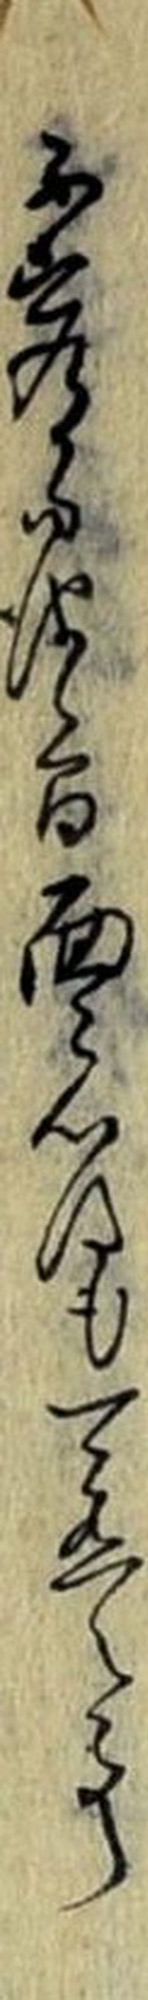不容易儀候間面々心得も可有之事
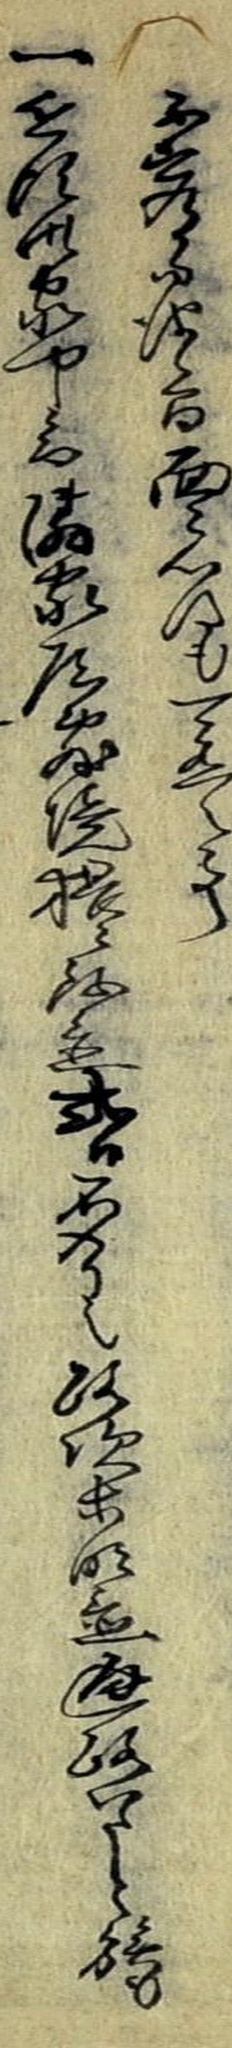一近頃御家中ニ而隣家屋敷境猥ニ致置或ハ不〆り之路次等明置通路いたし候族も
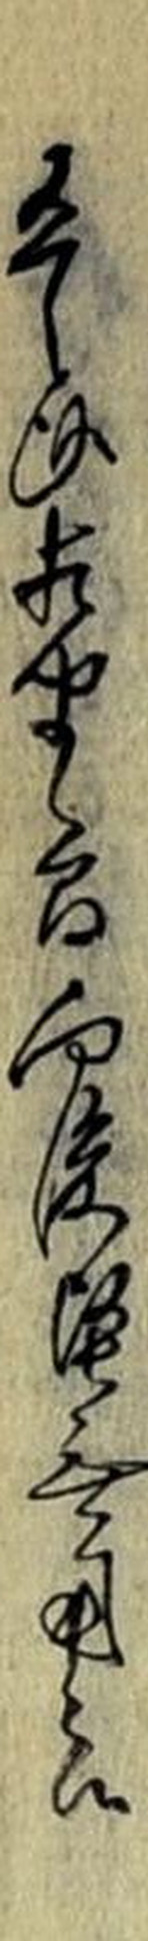有之趣相聞候間向後堅無用ニ候
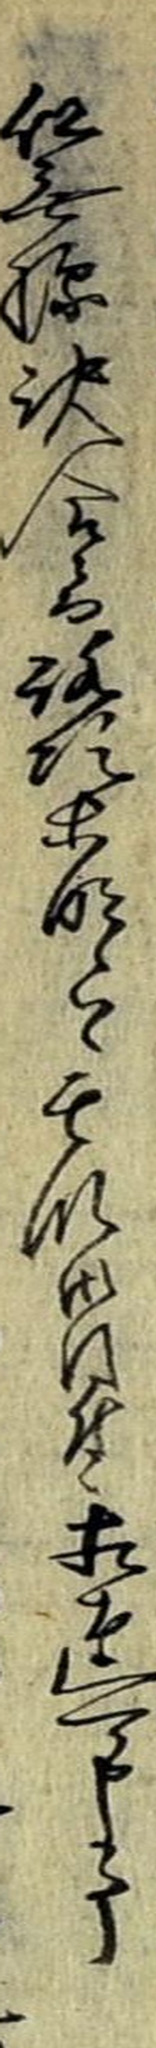但無拠訳合ニ而路次等明候ハヽ其段御目付へ相達可申事
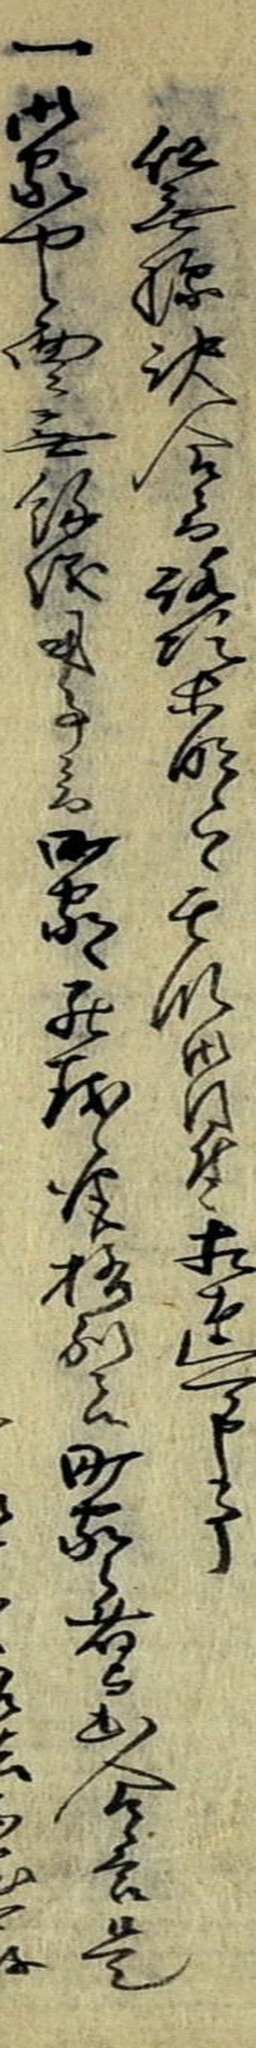一御家中面々無余儀用事ニ而町家へ罷越候儀ハ格別ニ候町家之者与出合候節是
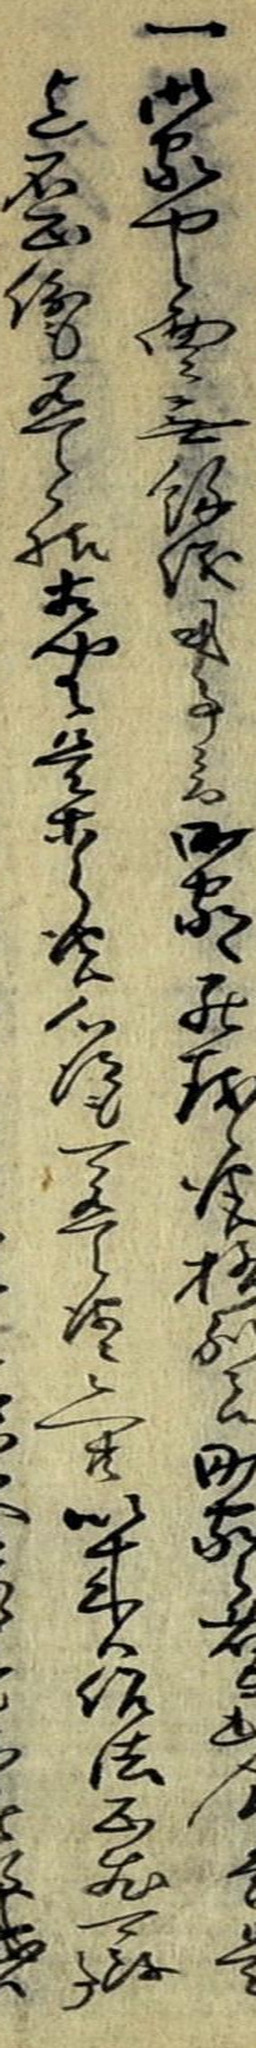迄不正儀も有之候様相聞候是等之儀ハ心得も可有之儀ニ候へ共以来ハ作法正敷可致事
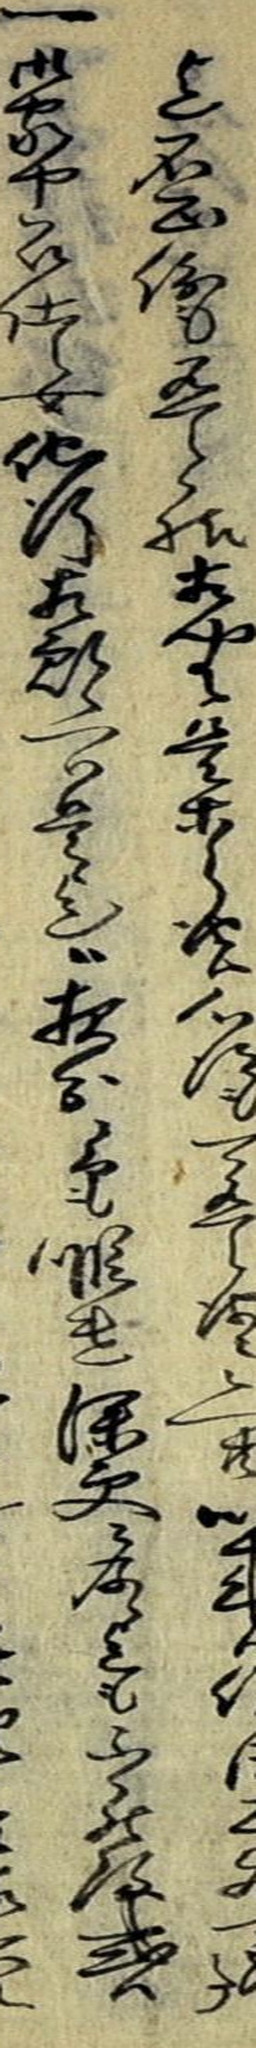一御家中召仕之女他行相願候ヘハ是迄ハ夜分ニ而も暇遣深更ニ及候迄も不罷帰或ハ
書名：命令之部 三
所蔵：福井県文書館 Fukui Prefectural Archives
